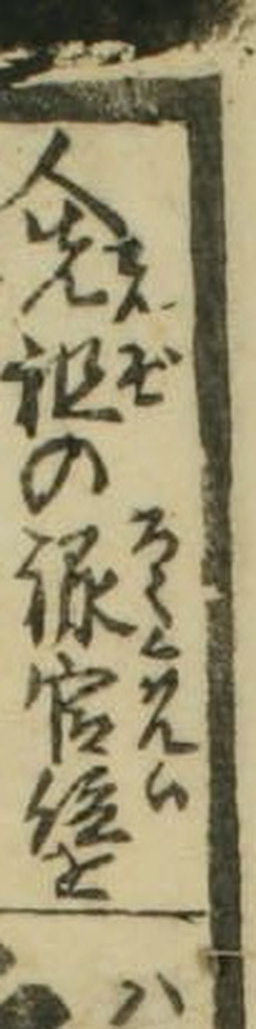人先祖の禄官位
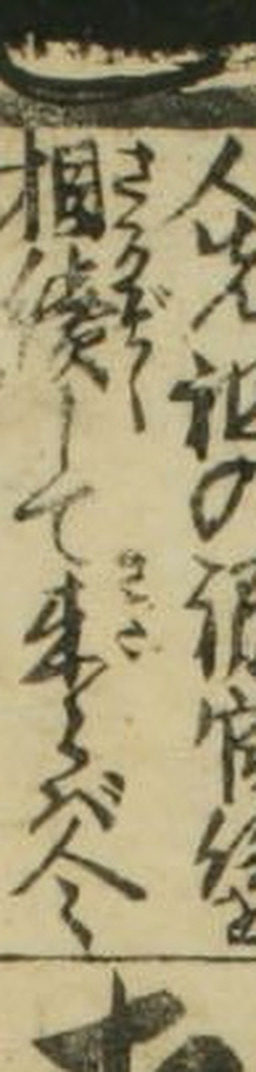を相続して来らば人々
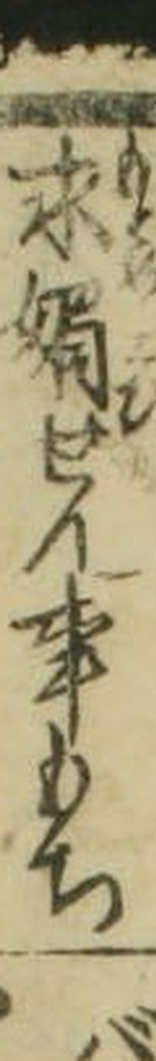求媚せん事もち
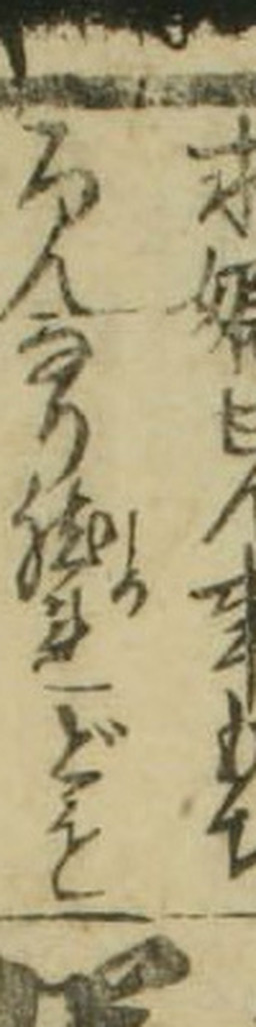ろんなり然れども
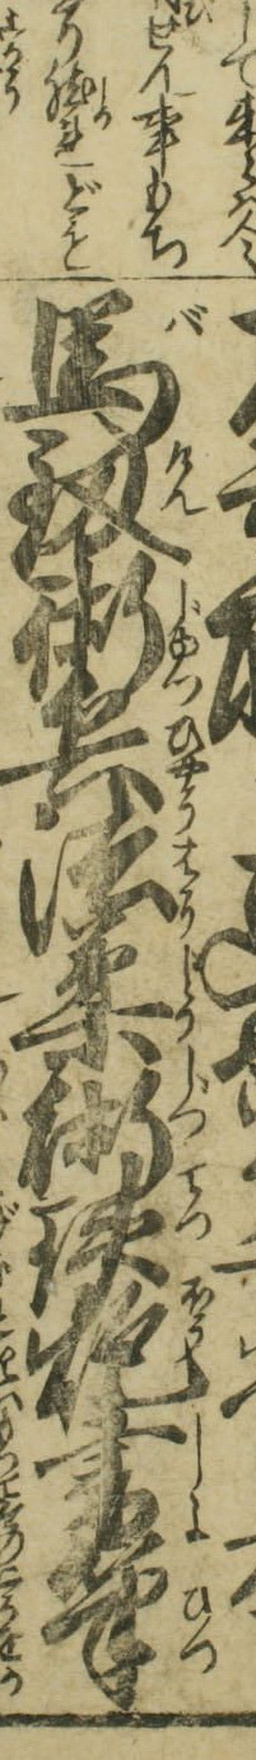馬剣術兵法柔術鉄砲書筆
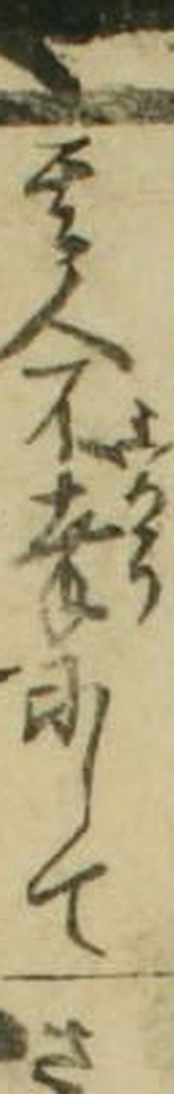其人不幸にして
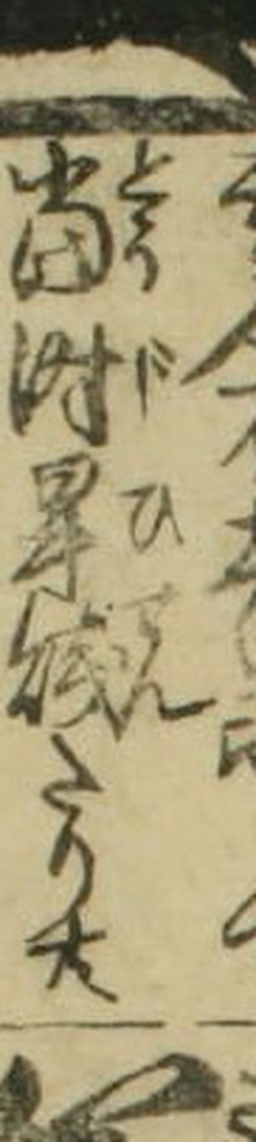当時微力たり共
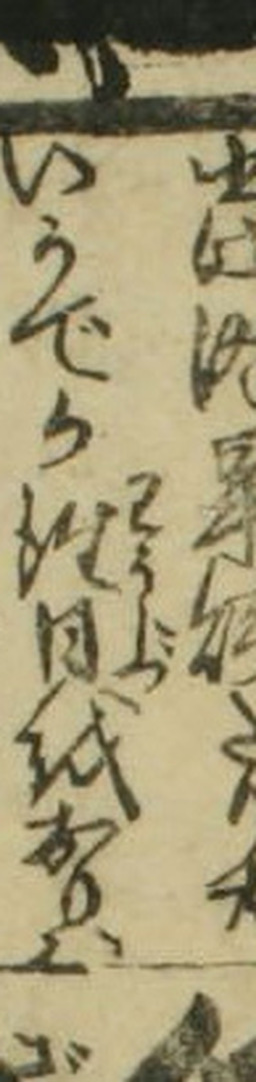いかでか往日をおもは
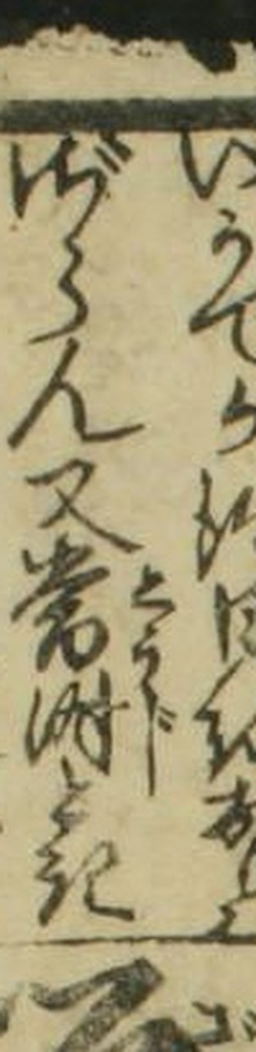ざらん又当時とき
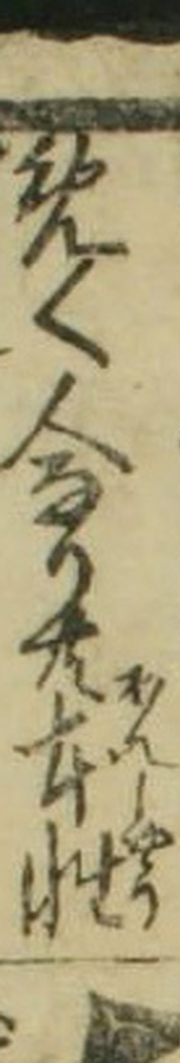めく人なり共本性
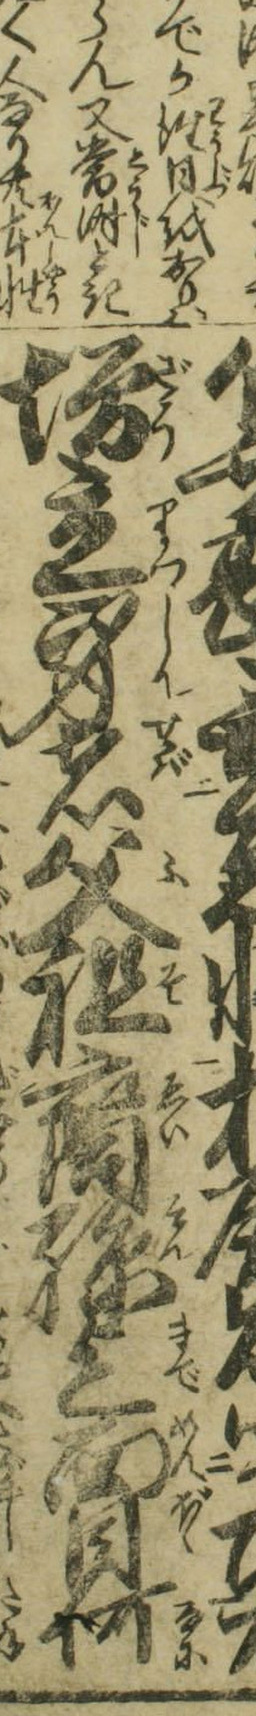増立身者父祖裔孫迄面目何
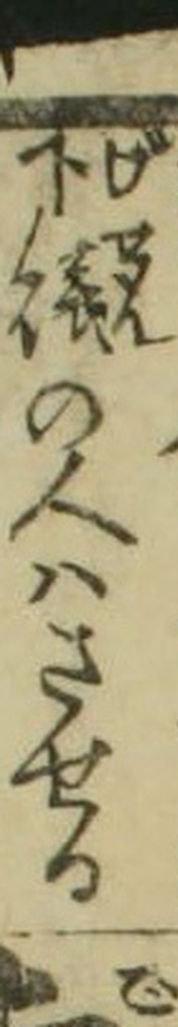下賤の人はさせる
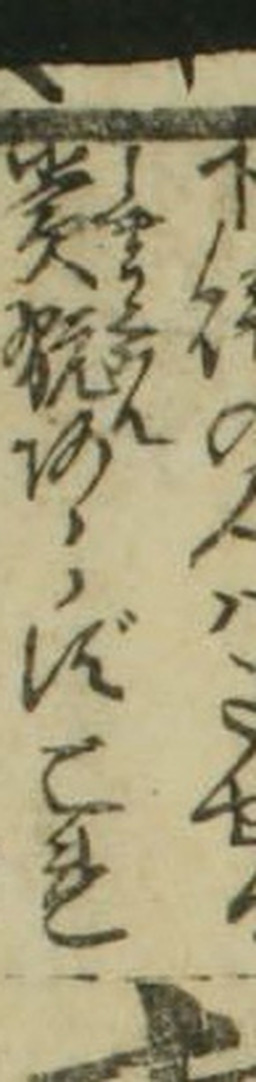賞翫あらずこれ
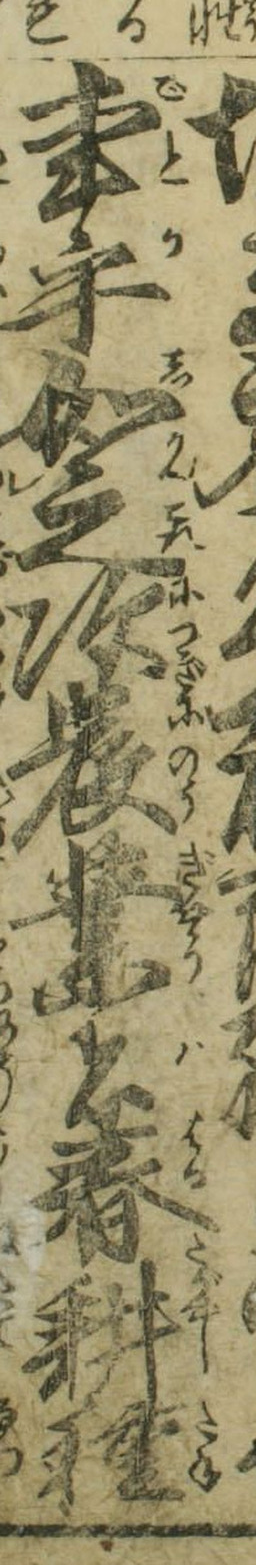事乎如之次農業者春耕種
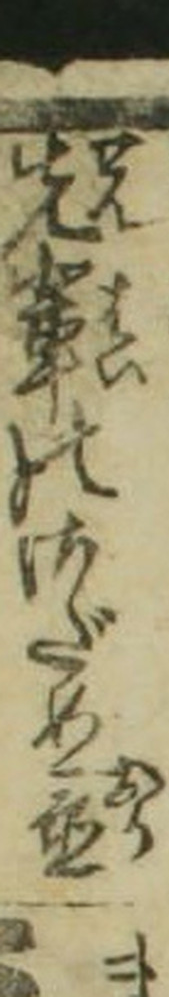先輩のさだめ置
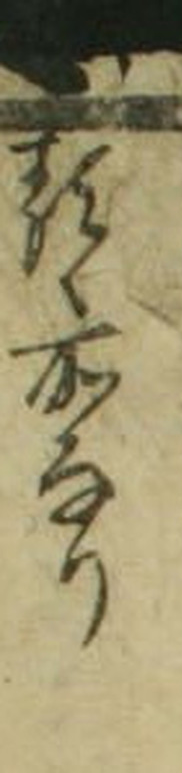るゝ所なり
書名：増補職人往来
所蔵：東京学芸大学教育コンテンツアーカイブ
